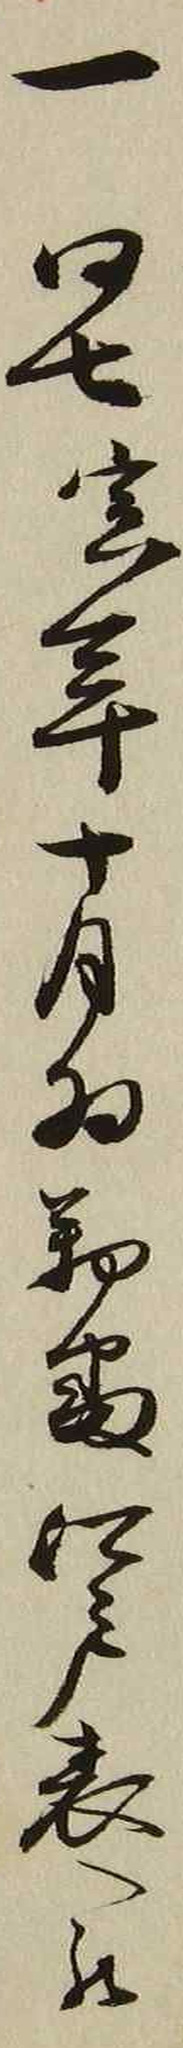一同七寅年十月為勤番江戸表へ罷
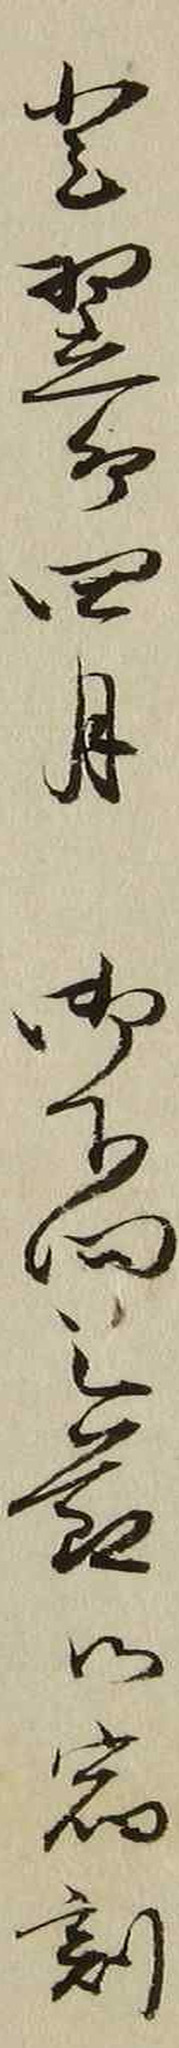登翌卯四月御下向之節御宿割
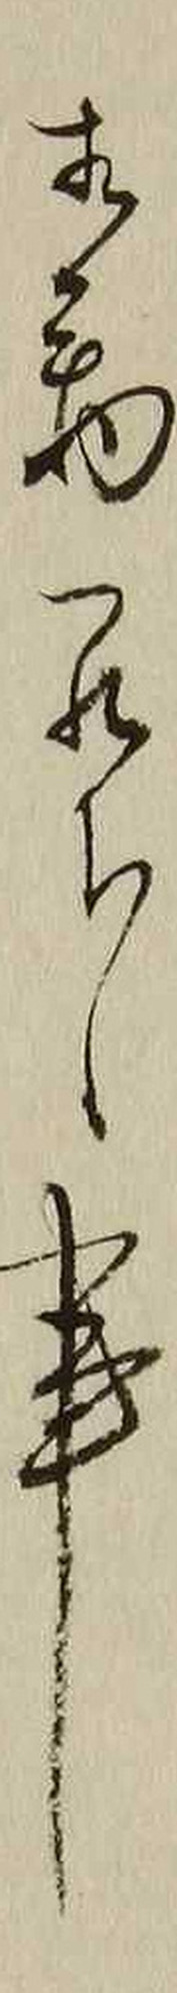相勤罷下候事
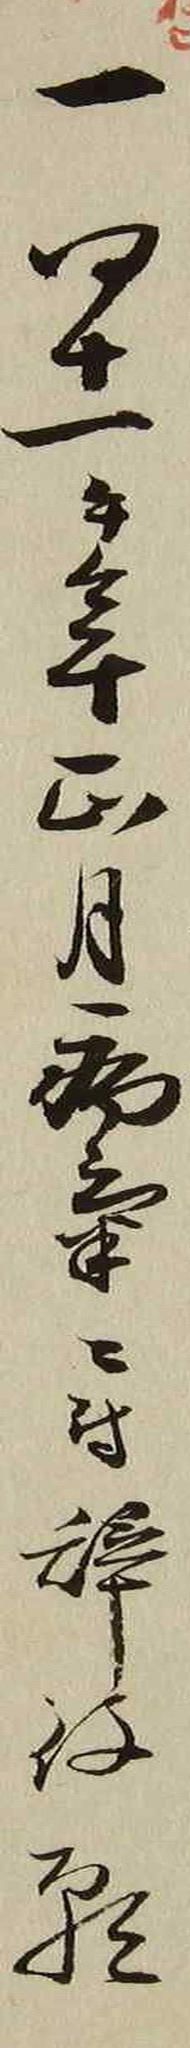一同十一午年正月病気に付辞役願
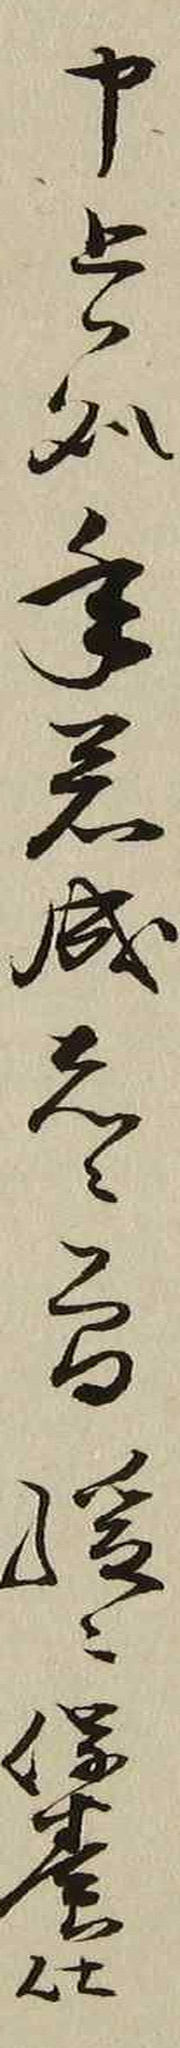申上候処年若成者に候間緩々保養仕
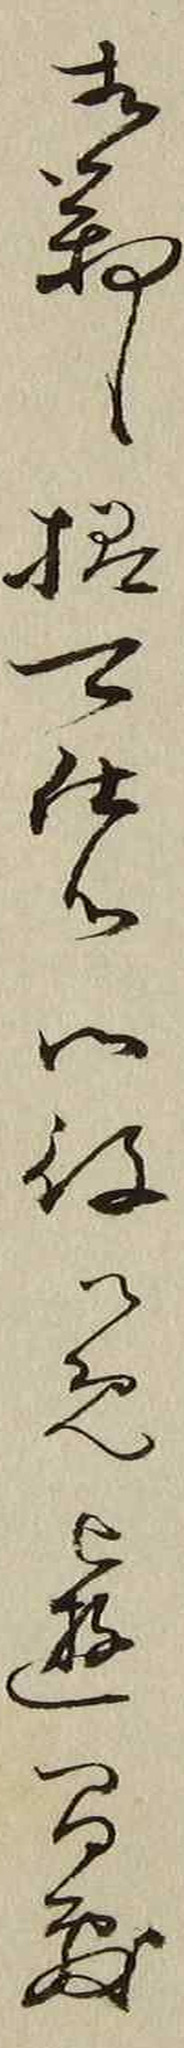相勤候様可仕候御役御免被遊間敷
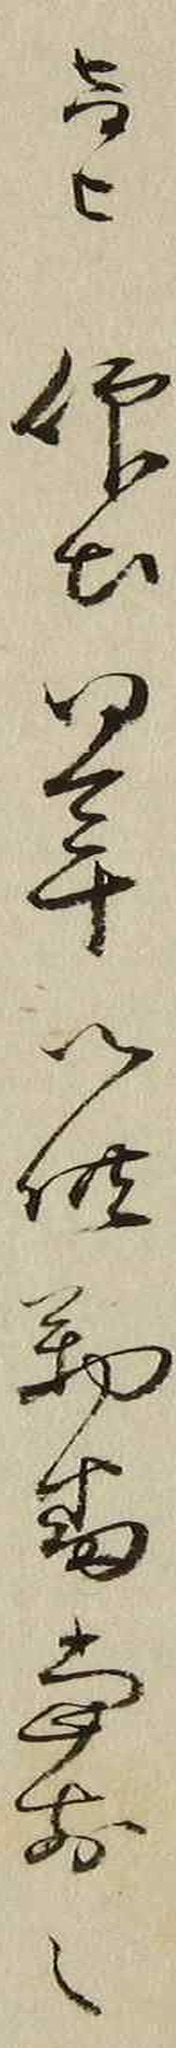旨被仰出同年御供勤番当前之
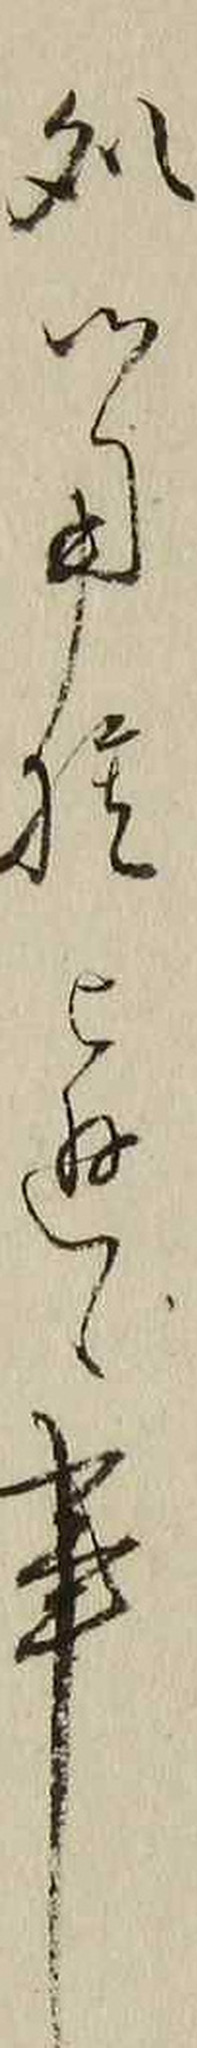処御用捨被遊候事
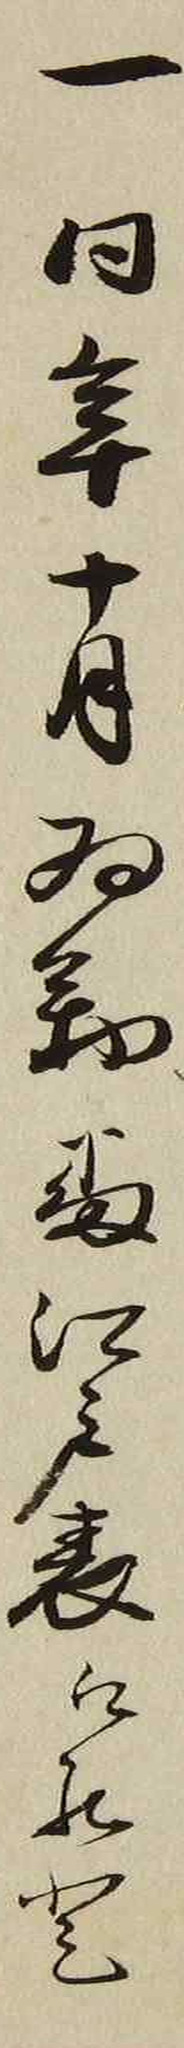一同年十月為勤番江戸表江罷登
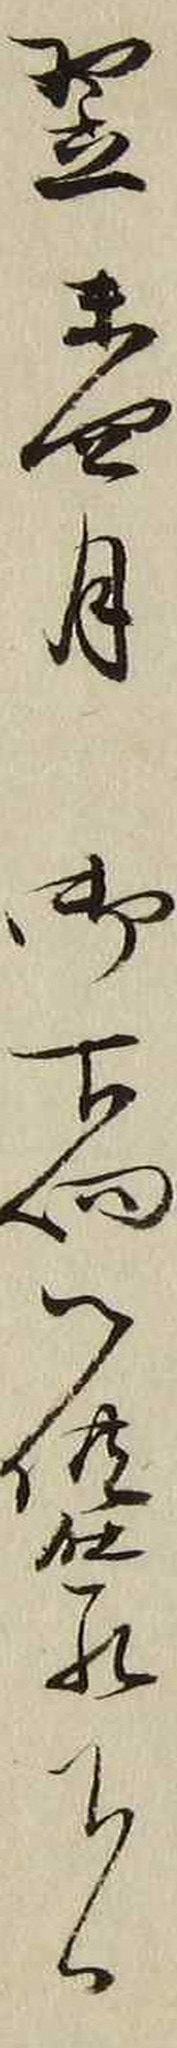翌未四月御下向御供仕罷下候
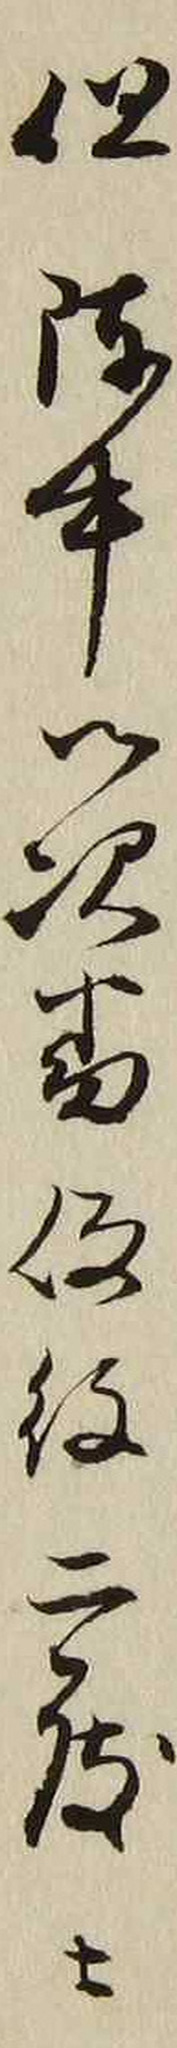但陣中御次番仮役二度被
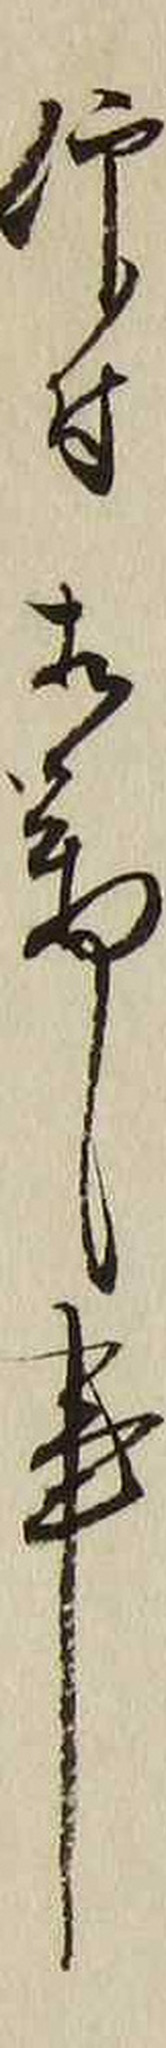仰付相勤候事
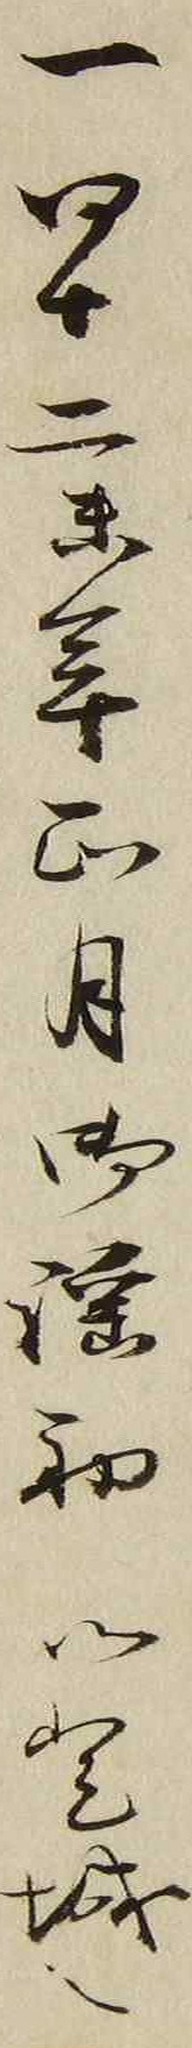一同十二未年正月御謡初御登城之
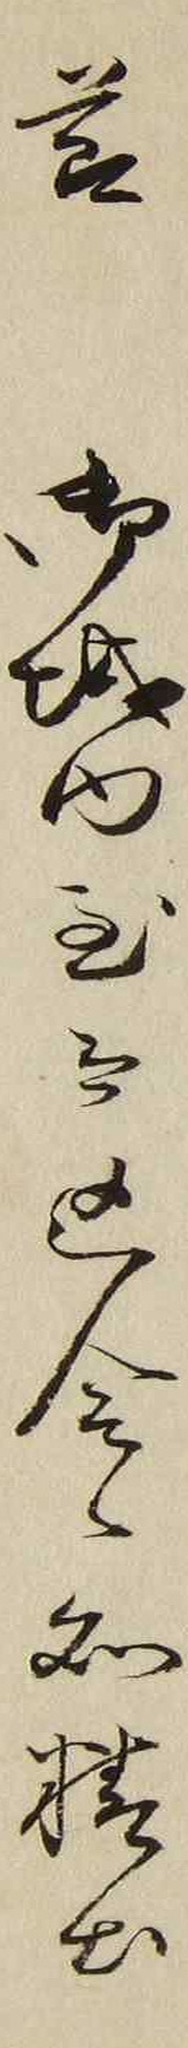節御城内至而込合候処精出

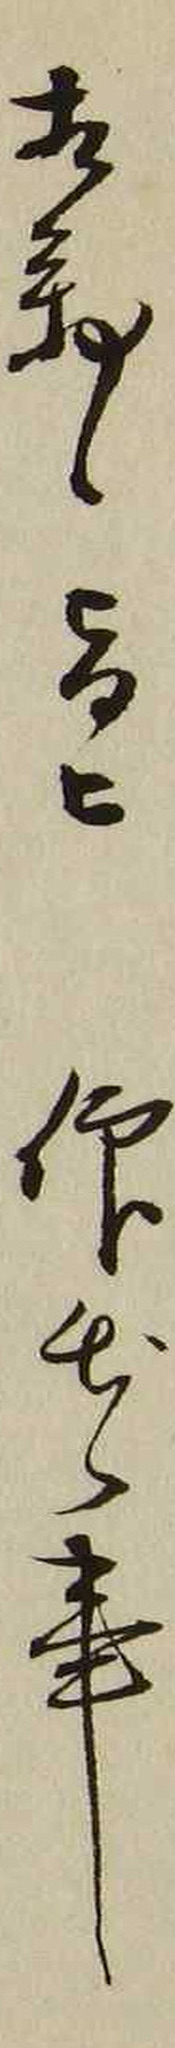相勤候旨被仰出候事
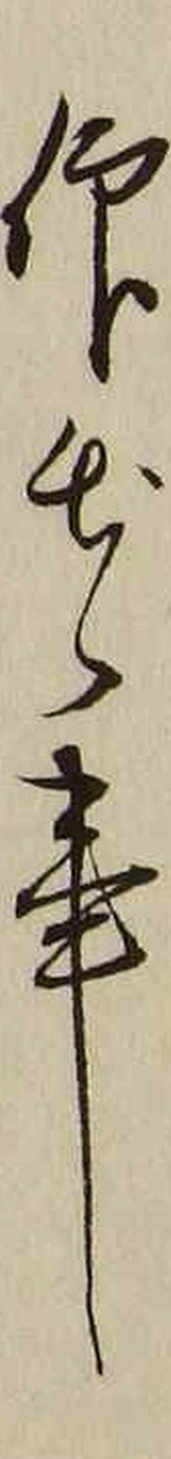仰付候事
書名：諸士系譜　巻之292　き之部1
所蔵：会津若松市立会津図書館
